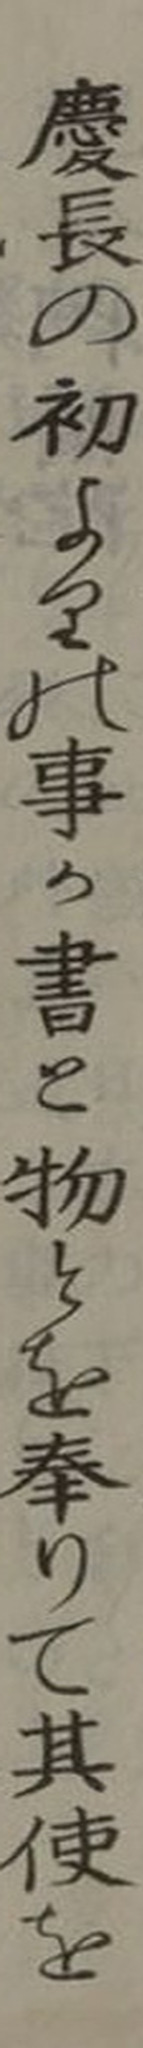慶長の初よりの事か書と物とを奉りて其使を
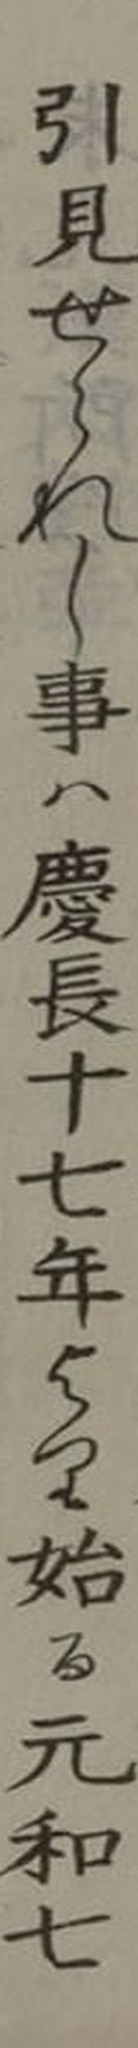引見せられし事ハ慶長十七年より始る元和七
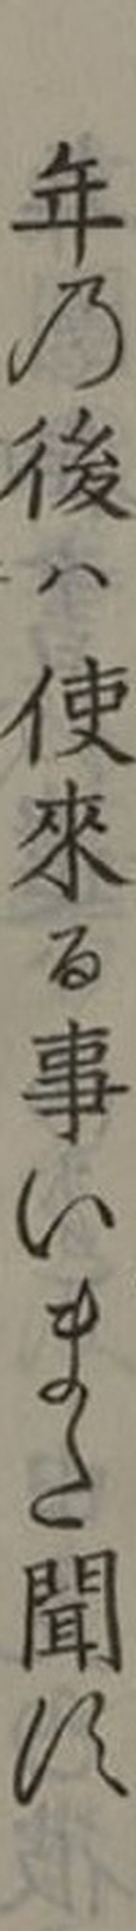年の後ハ使來る事いまた聞す

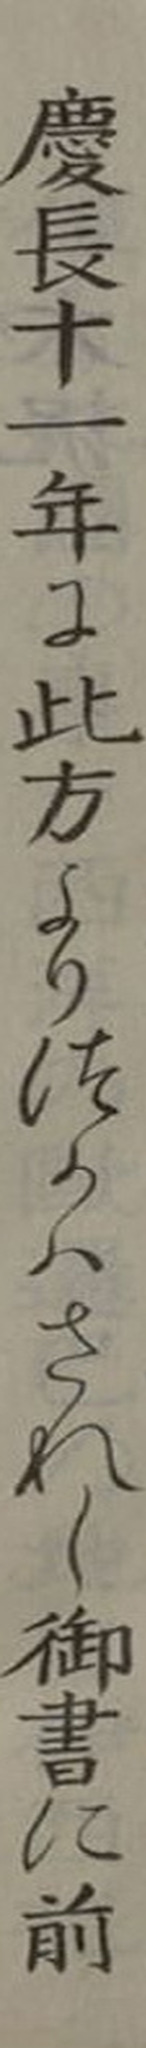慶長十一年に此方よりつかはされし御書に前
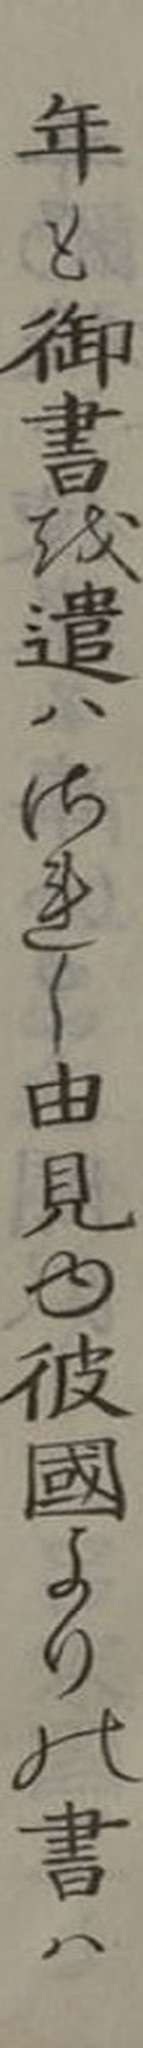年も御書を遣はされし由見ゆ彼國よりの書は
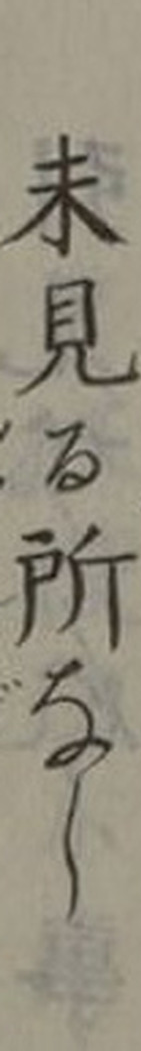未見る所なし
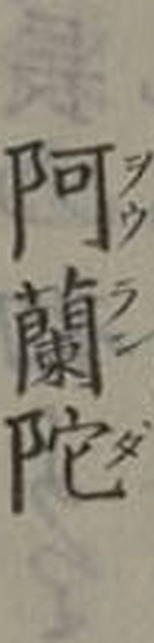阿蘭陀
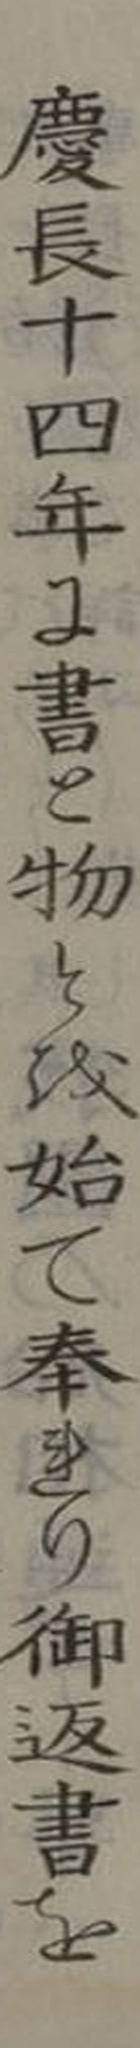慶長十四年に書と物とを始て奉れり御返書を
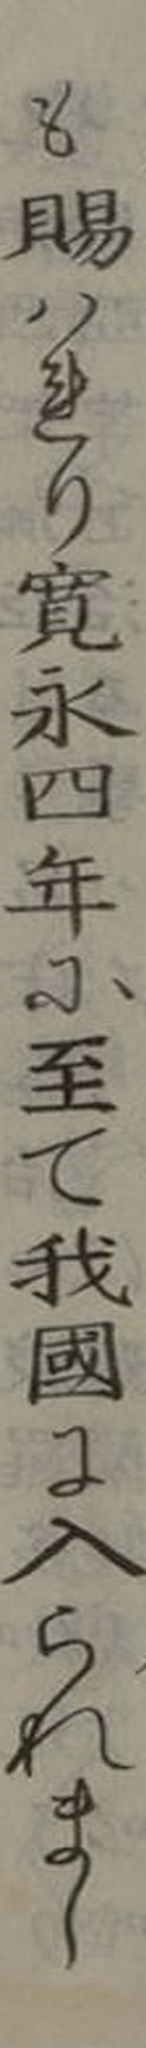も賜はれり寬永四年に至て我國に入られまし
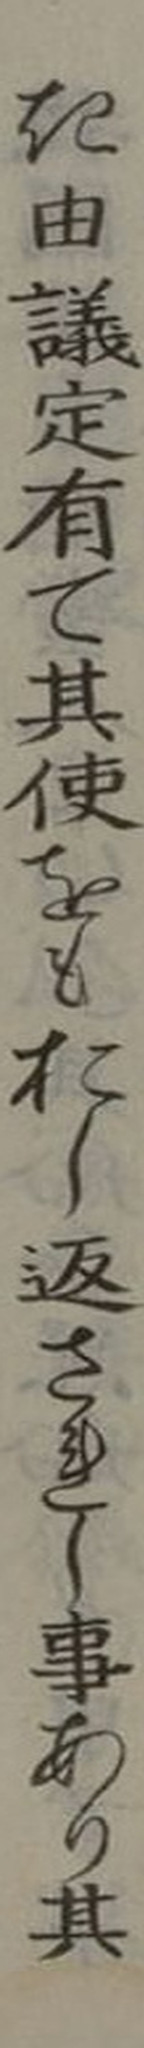き由議定有て其使をもおし返されし事あり其
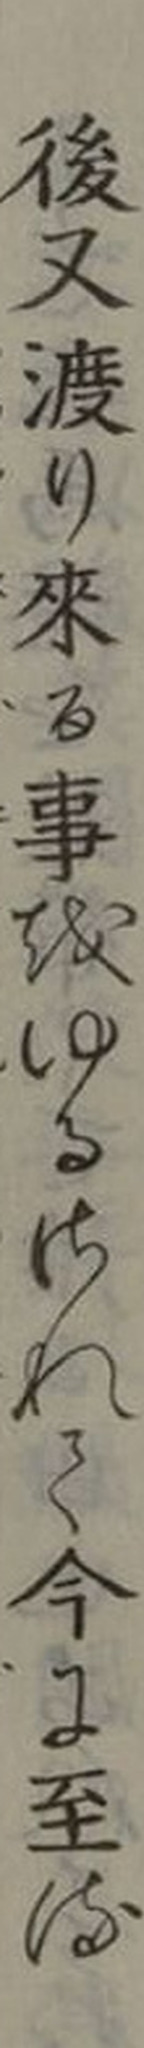後又渡り來る事をゆるされて今に至る
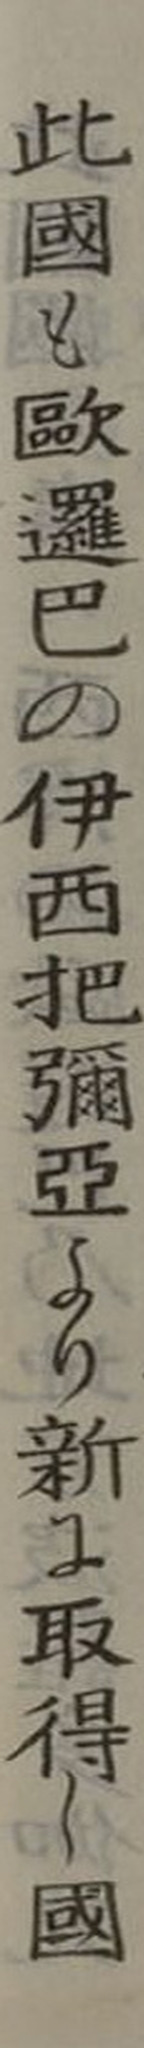此國も歐邏巴の伊西把彌亞より新に取得し國
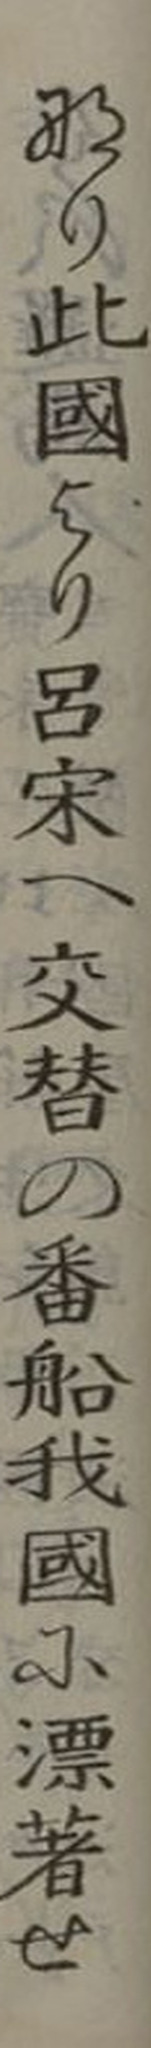なり此國より呂宋へ交替の番船我國に漂著せ
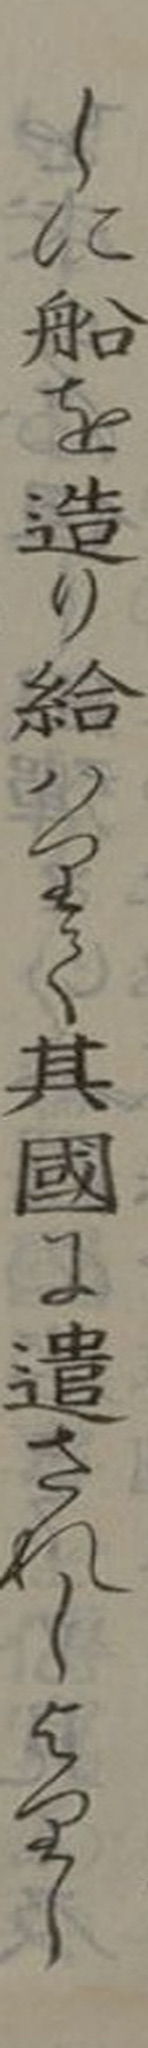しに船を造り給はりて其國に遣されしよりし
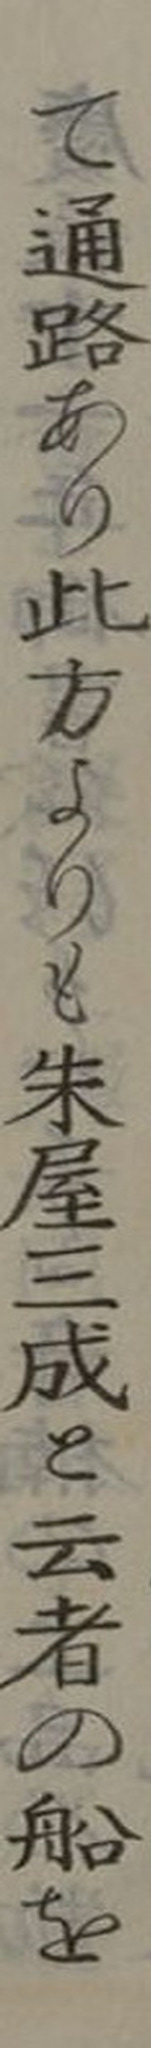て通路あり此方よりも朱屋三成と云者の船を
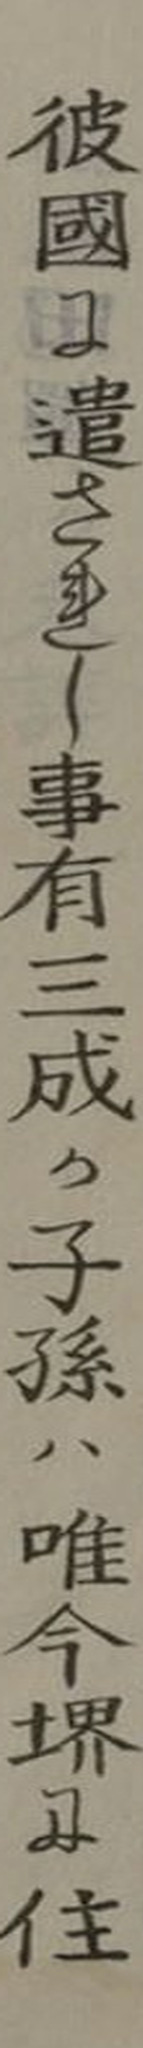彼國に遣されし事有三成か子孫は唯今堺に住
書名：骨董録
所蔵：University of the Ryukyus Library
